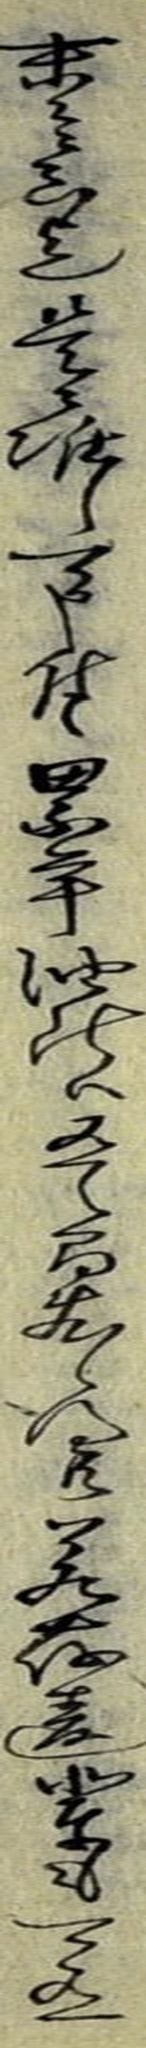末々ニ至迄是ニ准し可申付候累年油断ハ有之間敷候得共若存違輩も可有
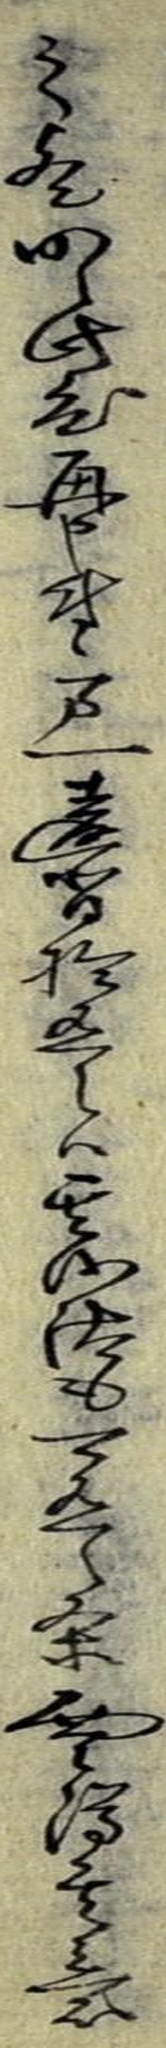之歟仍之此度再申付候万一違背於有之ハ其沙汰も可有之条面々得其意
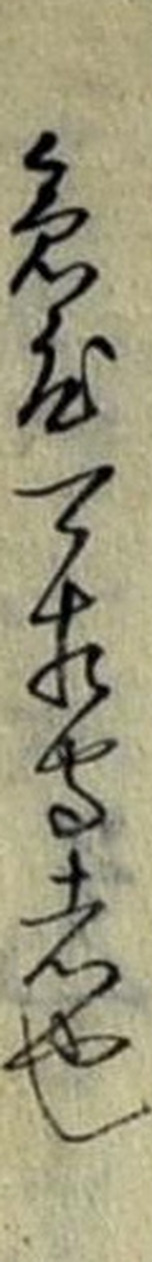急度可相守者也
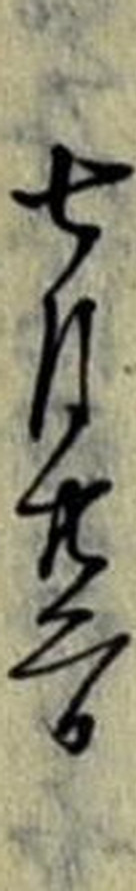七月廿二日
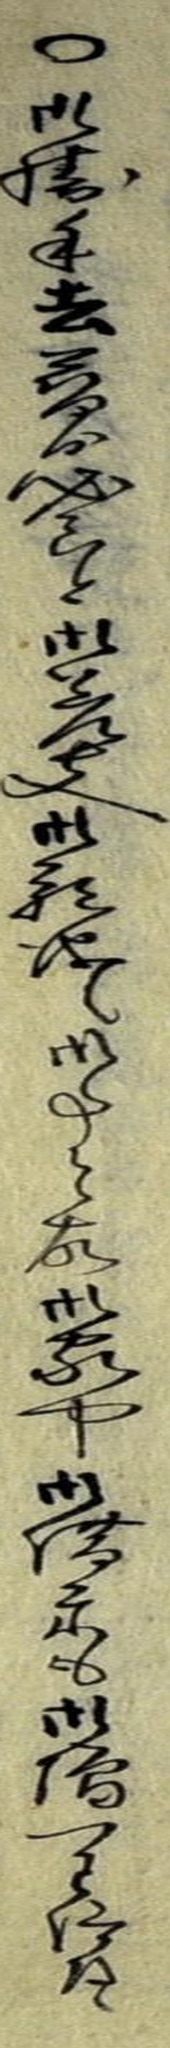〇御勝手去暮ゟ必至と御差支御難儀之御事ニ候故御家中御借米も御増可被仰付候
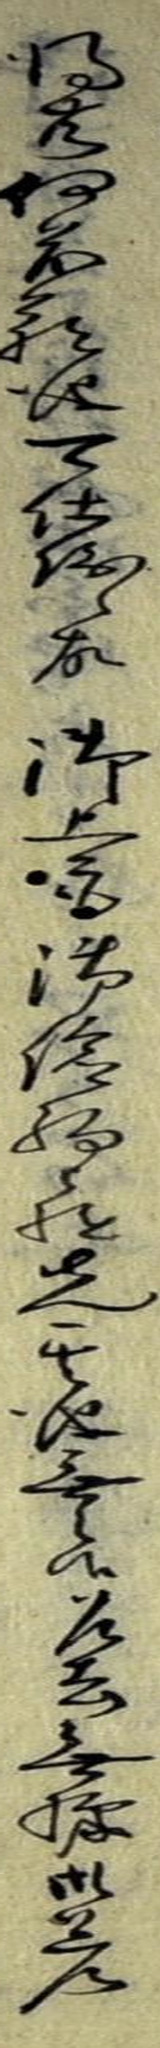得共何茂難儀可仕儀候故御上ニも御倹約被遊先其儀無之候乍去無拠御差
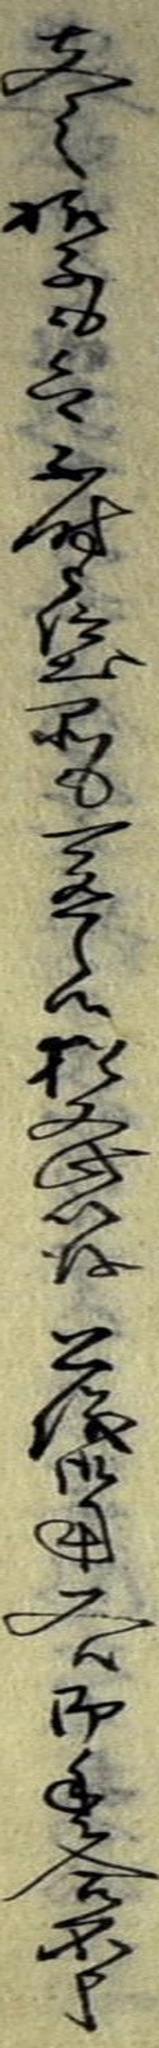支之様子も候ハヽ不時被仰出品も可有之候猶又此以後公儀御用又ハ御手ニ合不申

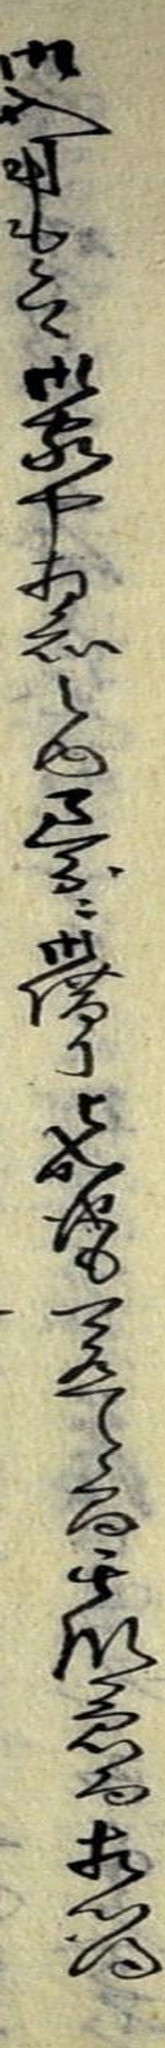御入用も候ハヽ御家中拝知之内過分ニ御借り被成儀も可有之候間其段兼而相心得
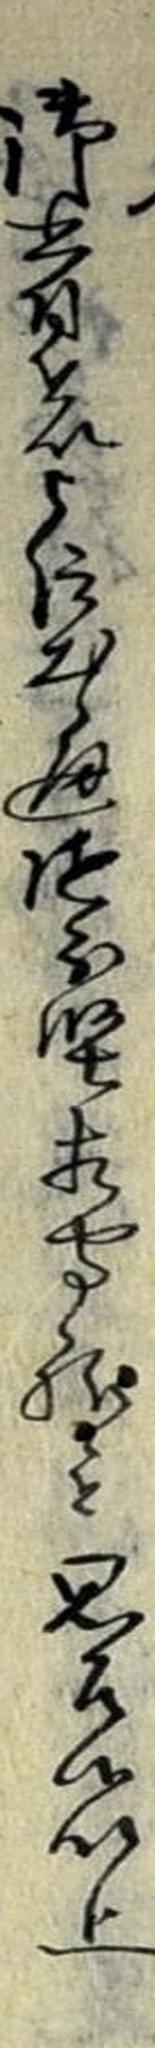御書付を以被仰出候通随分堅相守候様ニと思召候以上
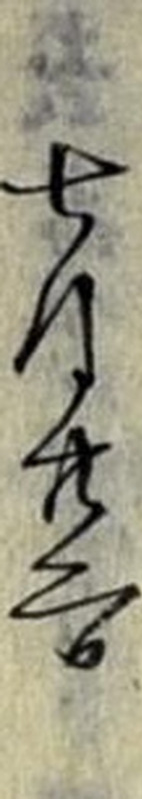七月廿二日
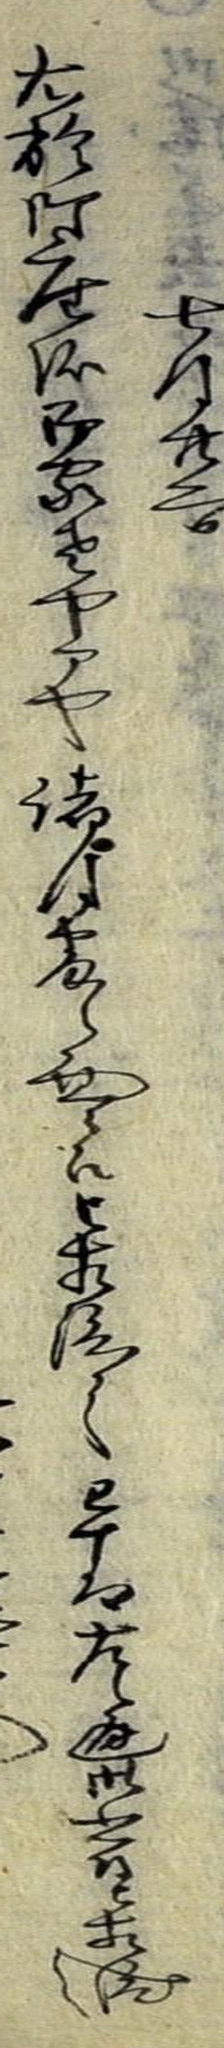右於御座所御家老中部屋諸月番之面々江被相渡之畢而左之通御書付被相渡之
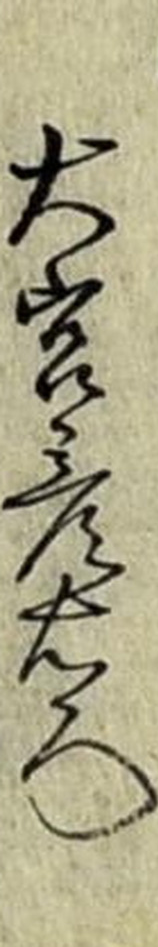覚大宮彦右衛門
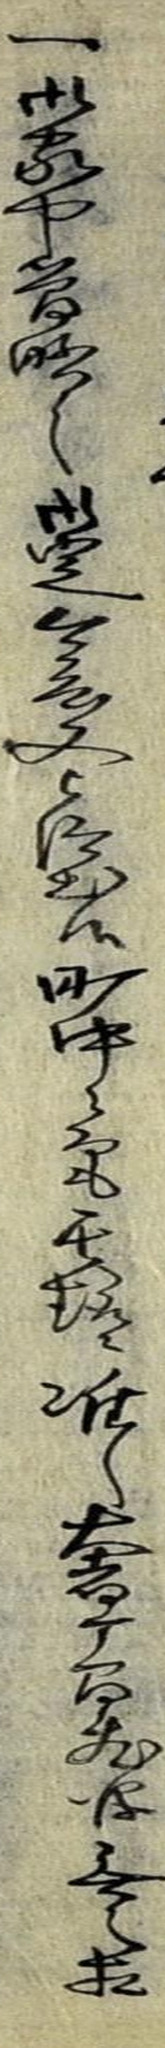一御家中簡略之御定今度又被仰出候町中ニ而も其趣ニ准し奢ケ間敷儀無之相
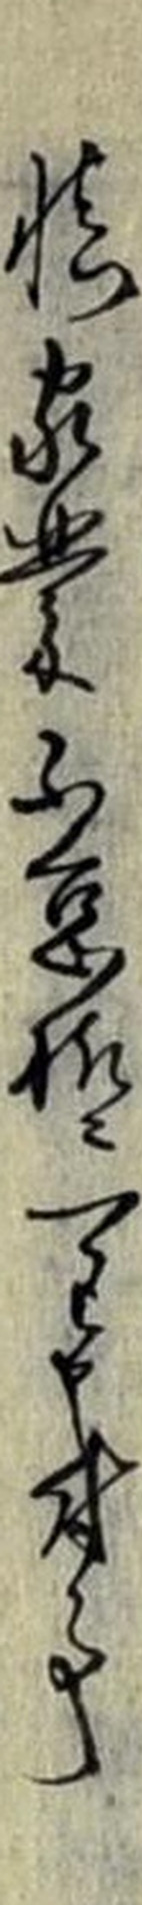慎家業不怠様ニ可被申付事
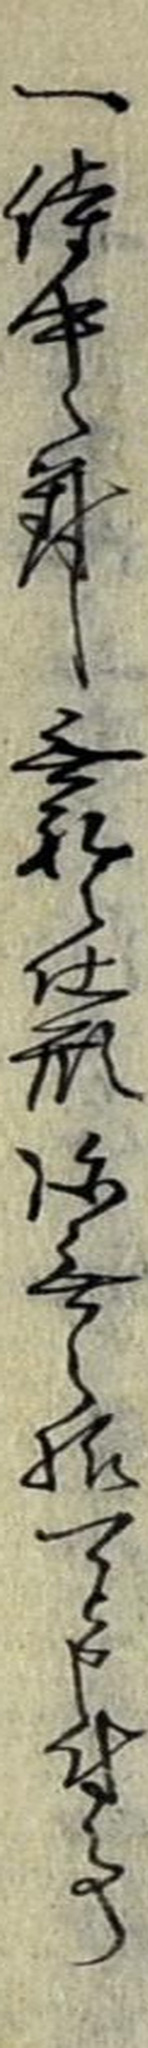一侍中へ対し無礼之仕形弥無之様可被申付事
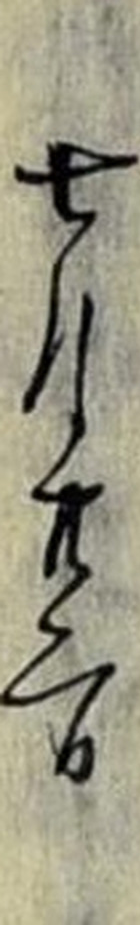七月廿二日
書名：命令之部 一
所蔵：福井県文書館 Fukui Prefectural Archives
